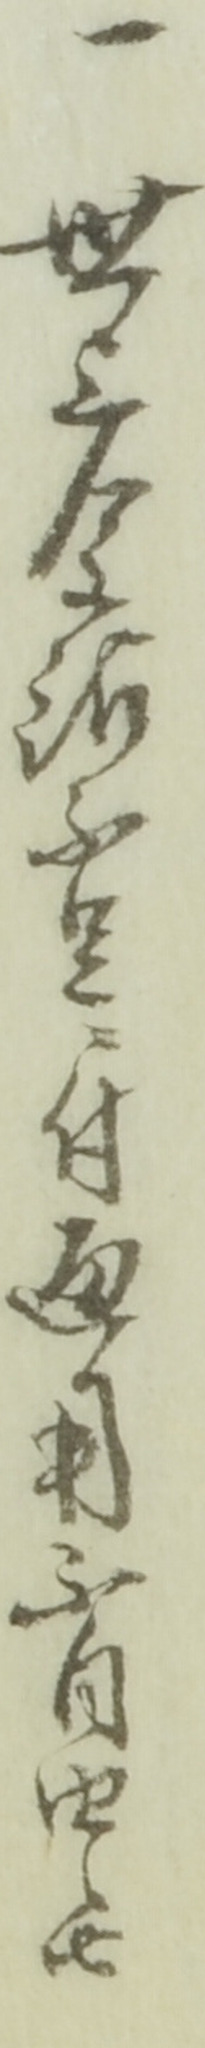一世上金銀不足二付通用不自由之由
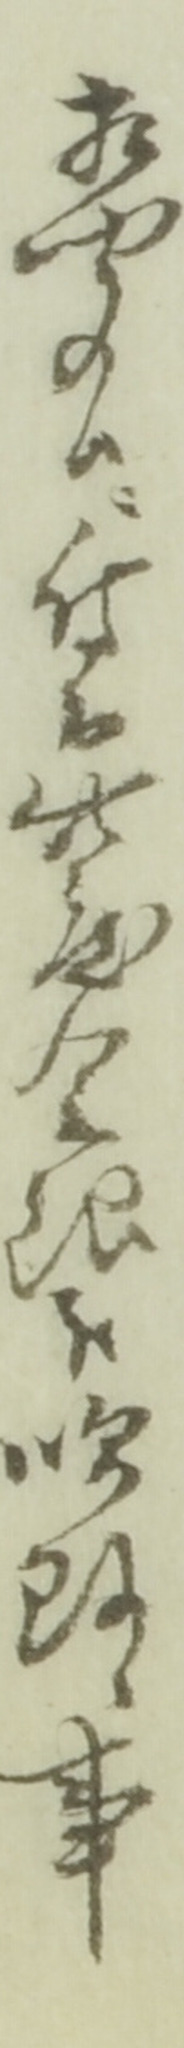相聞候二付而此度金銀被吹改候事
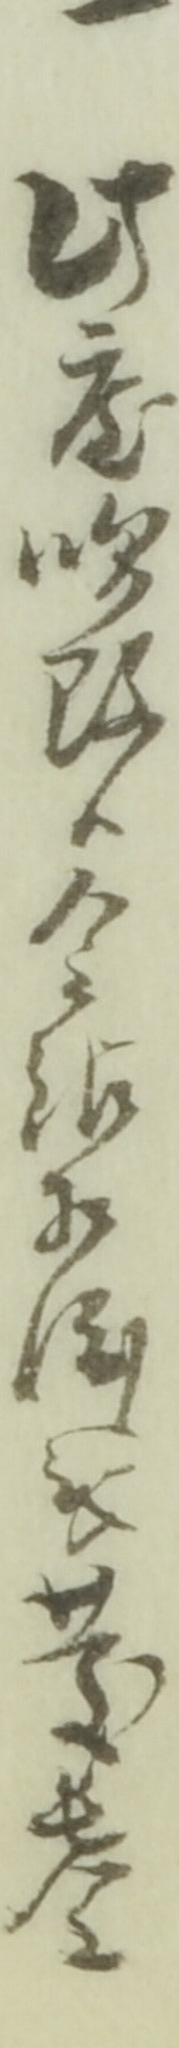一此度吹改候金銀相渡候共慶長金
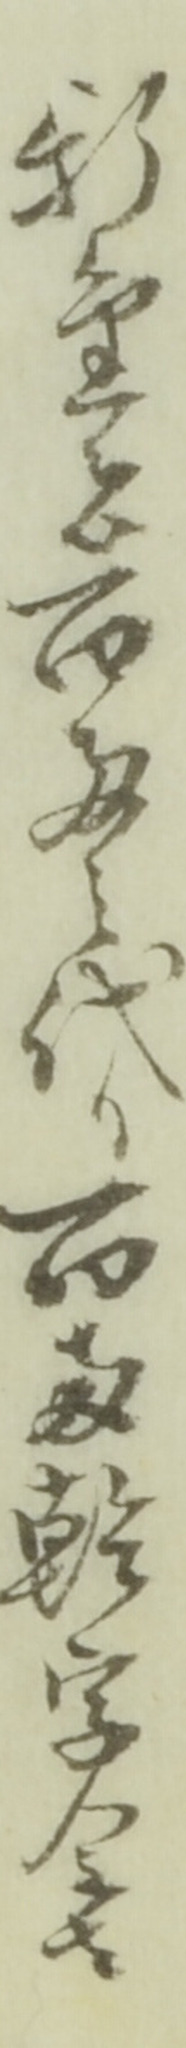新置者百匁之代り百両乾字金者
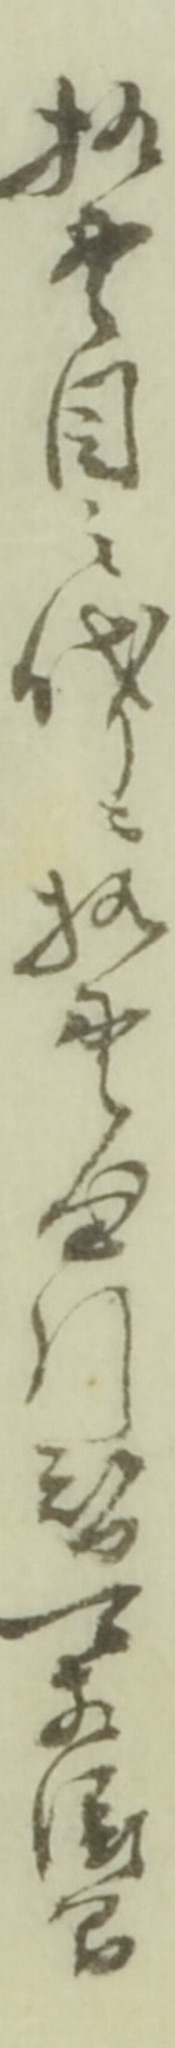拾貫目之代り二極中金引替可相渡候間
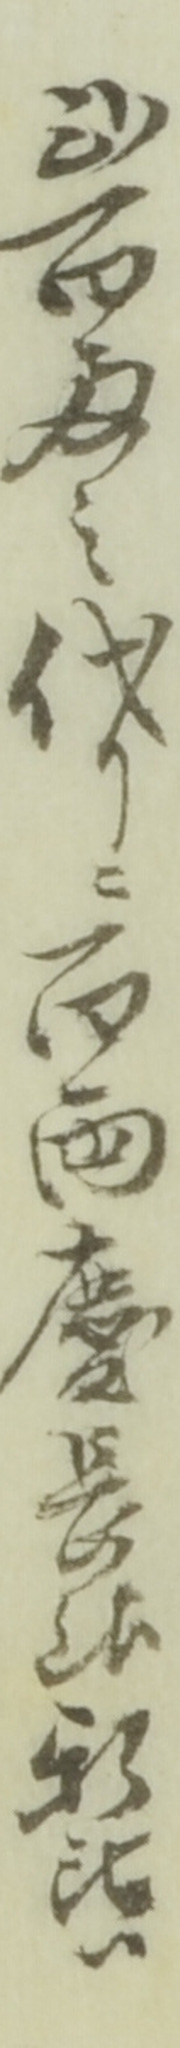弐百両之代り二百両慶長銀新沽ハ
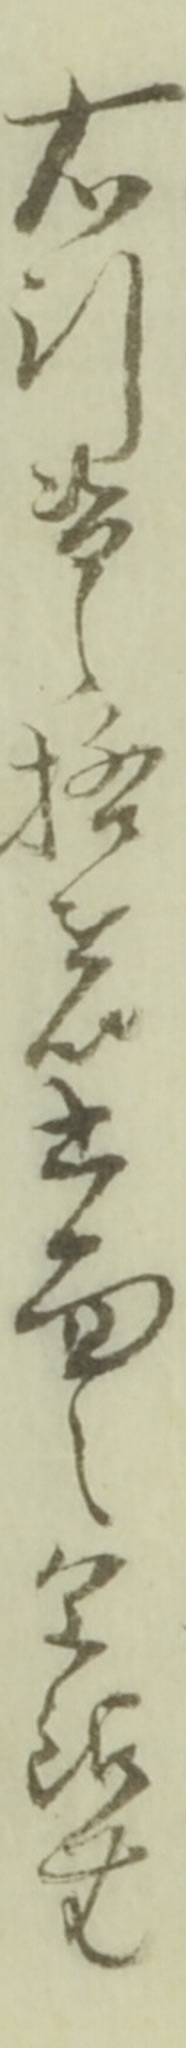右引替候積を以書面之金銀無
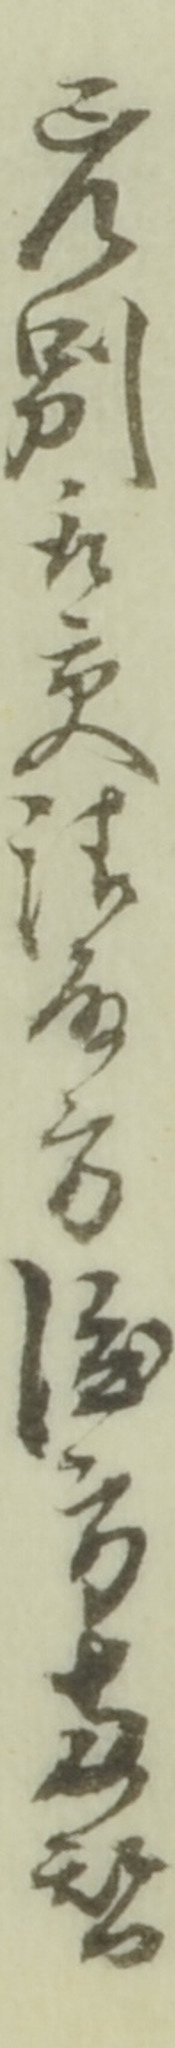差別取受請殿方渡方両替
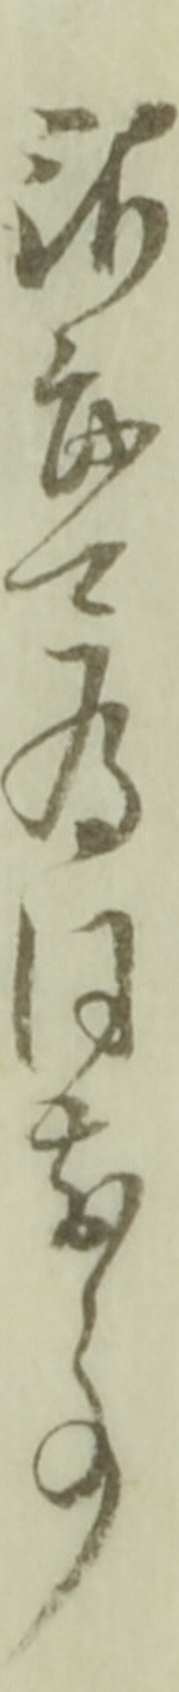沽茂可為同前之事
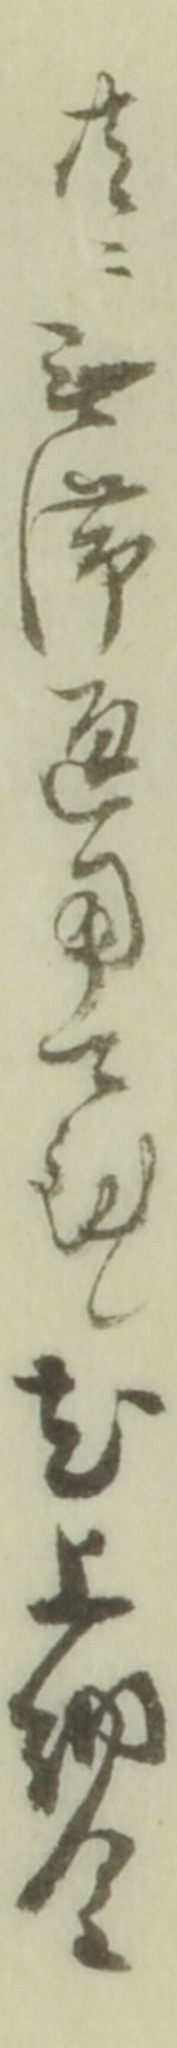共二無滞通用可致候尤上納金
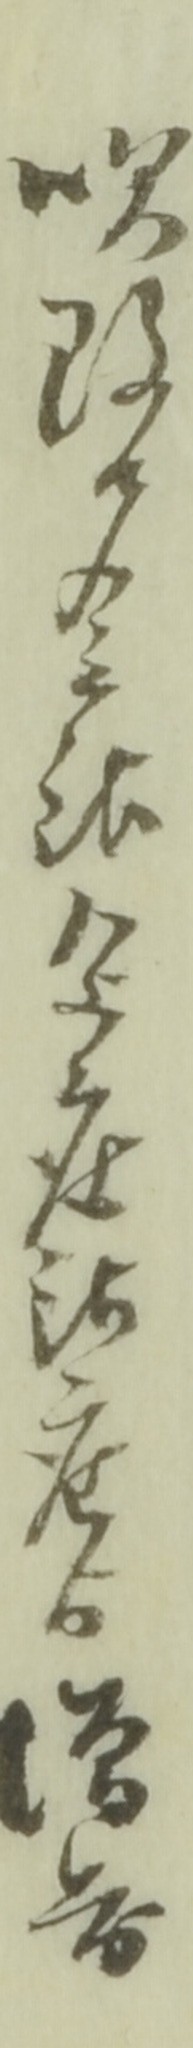一吹改候金銀金座銀座より増図
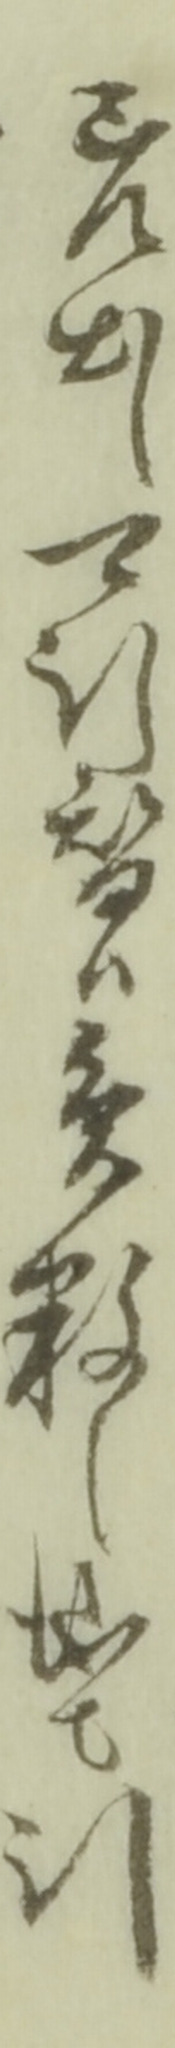差出候可引替ハ員数之場儀も引
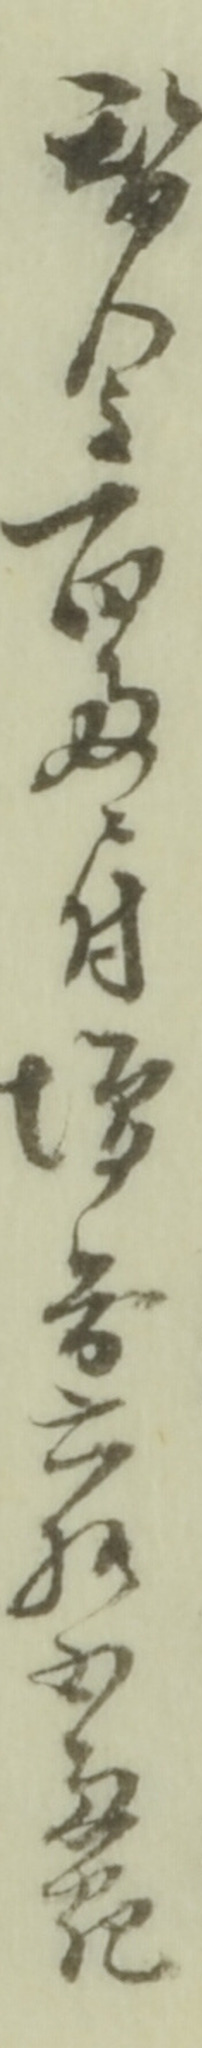替金百匁二付増図六拾五匁宛
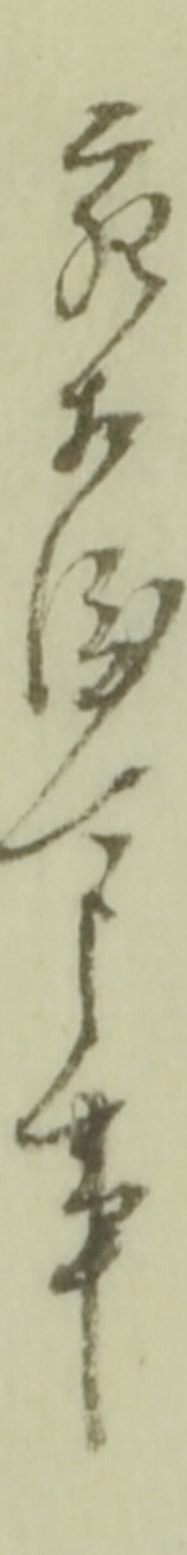宛相渡可申事
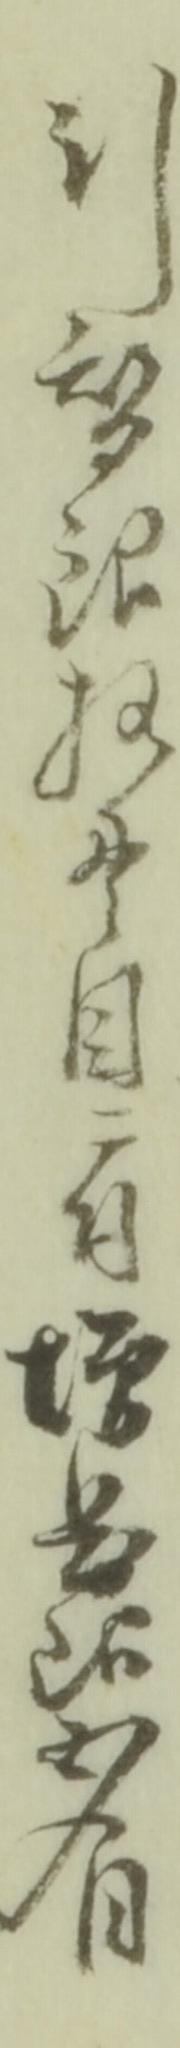引替銀拾貫目二付増図銀五匁目
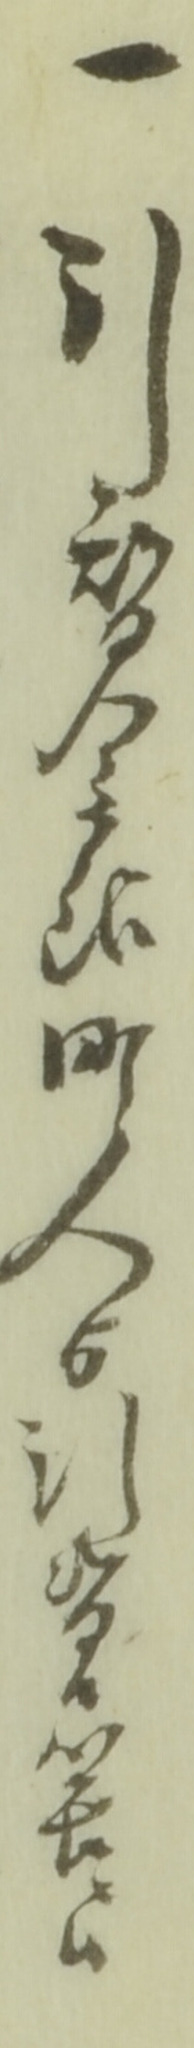一引替金銀町人より引替候筈二候
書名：御公儀様御領主様御触書控
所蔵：伊那市立高遠町図書館・合同会社AMANE
